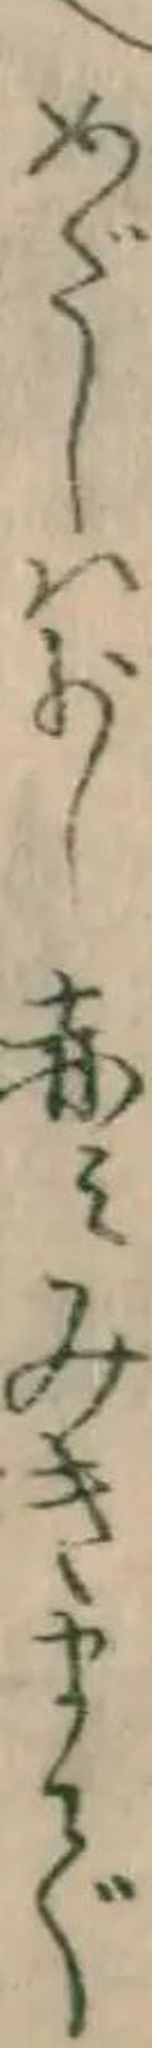めだしは少し赤みみきまで

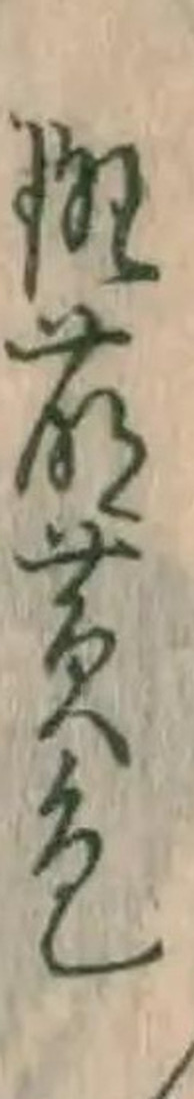斑萌黄色
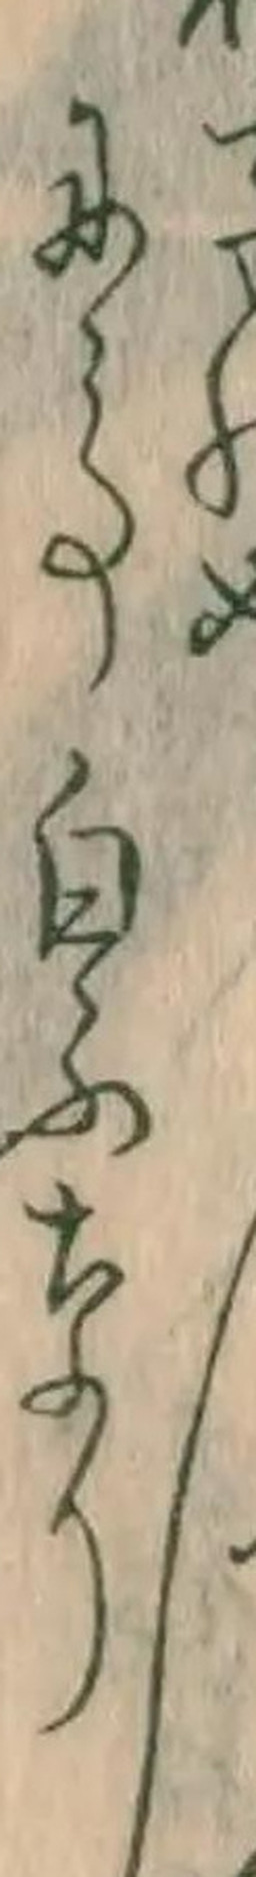にて白ふなり
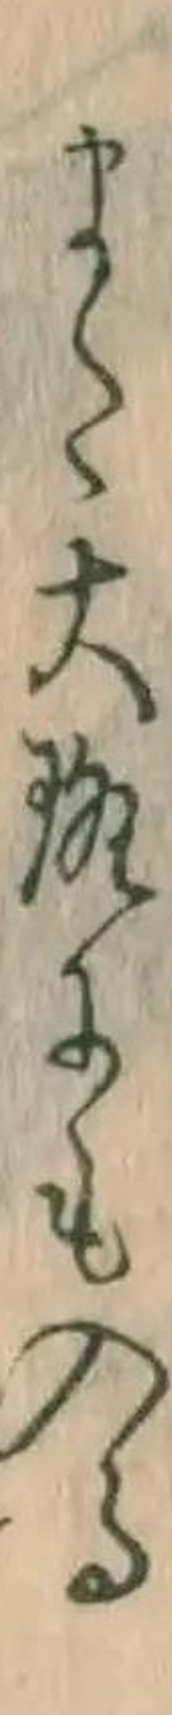また大斑にも入る
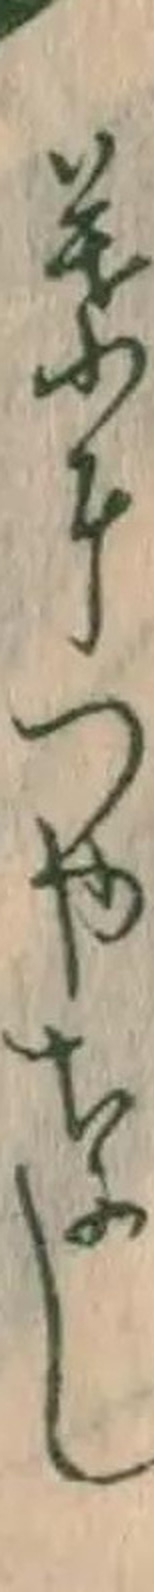葉につやなし
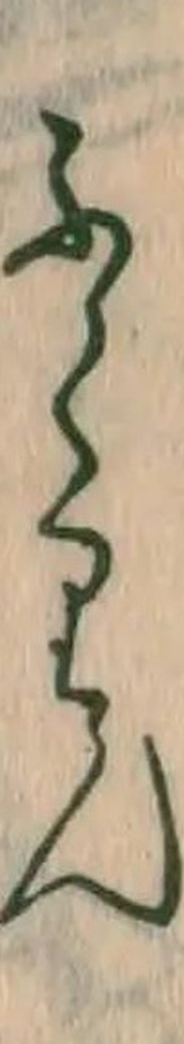ふくりん
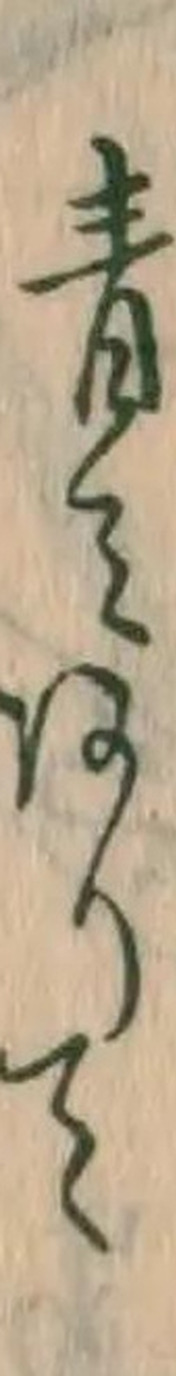青みありて
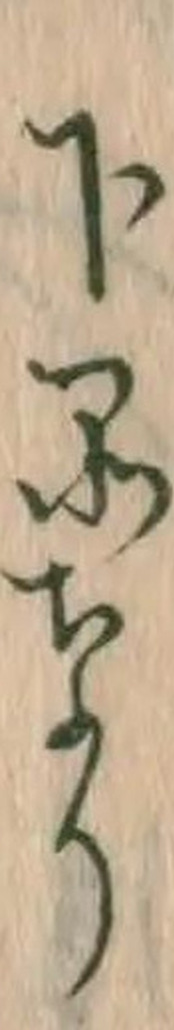下品なり
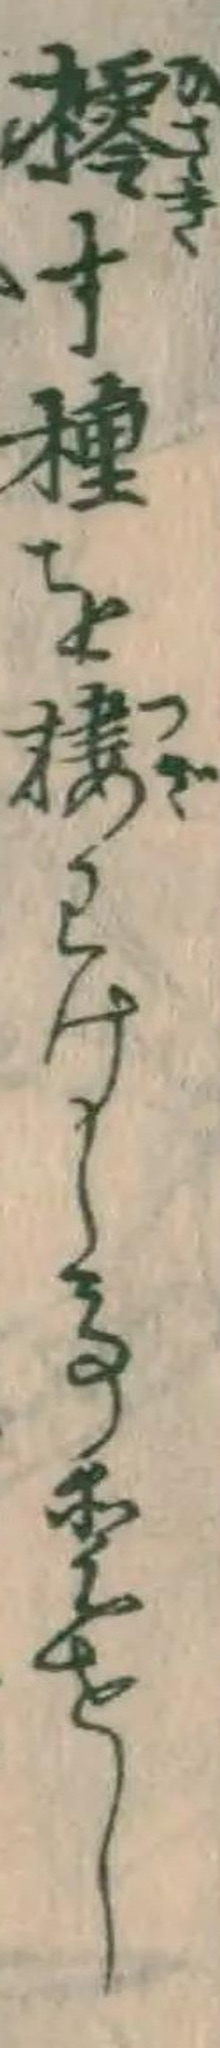㯪十種を楼わけして愛せし
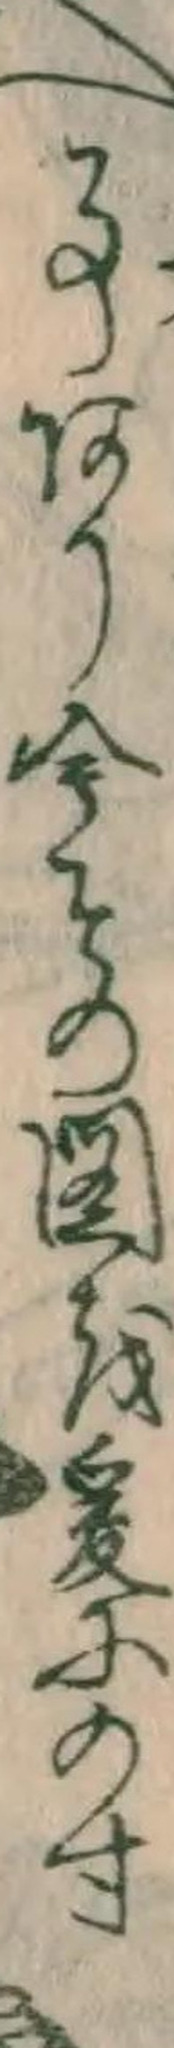事あり今その図を爰にのす雲停
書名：草木奇品家雅見 3巻. [3]
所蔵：国立国会図書館 National Diet Library, JAPAN
